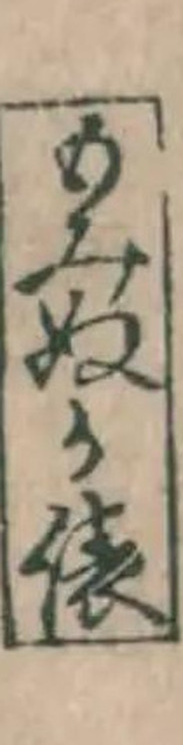もみぬか俵

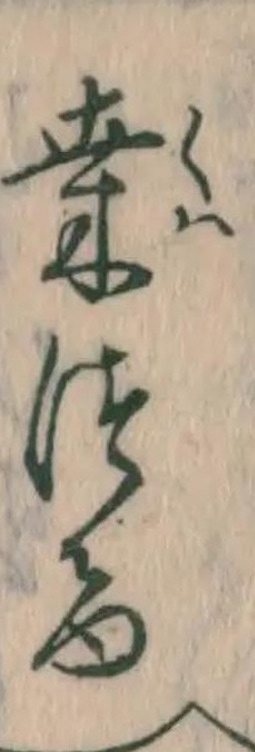桑つけ
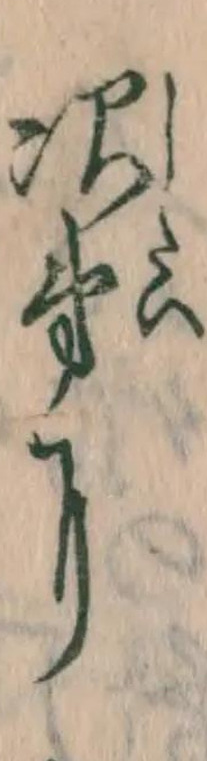次第に
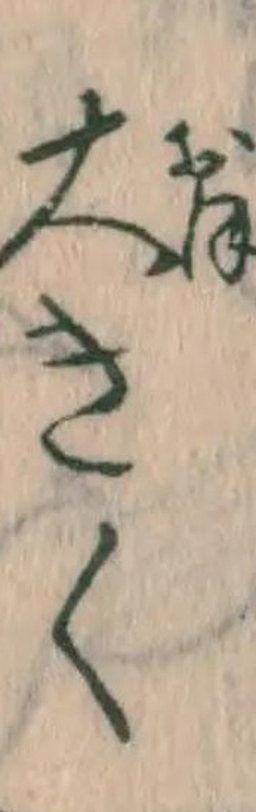大きく
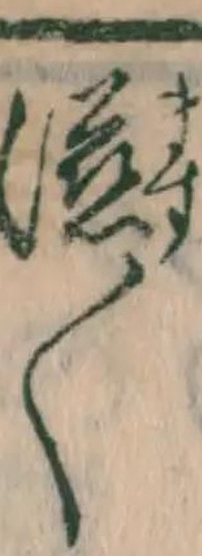滋〳〵
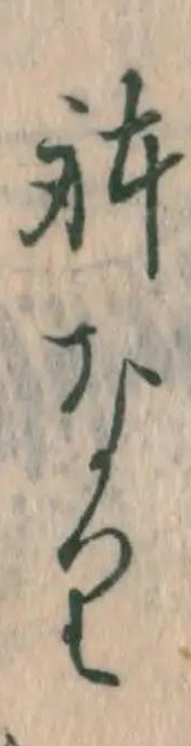体なり

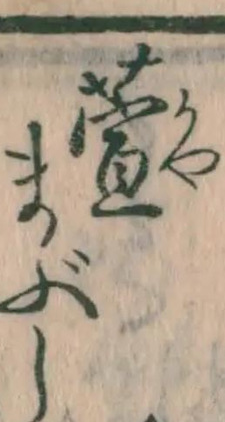まぶし
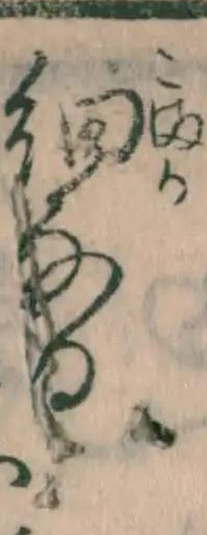細なる
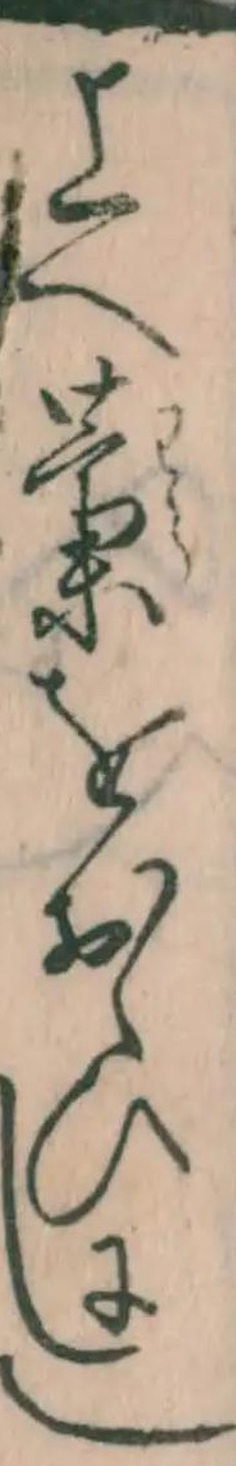上へ藁をおゝひにして
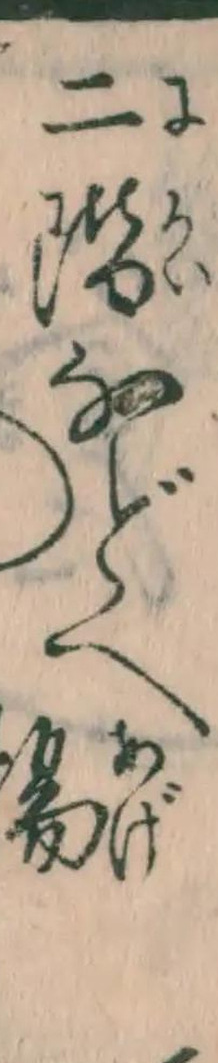二階などへ揚
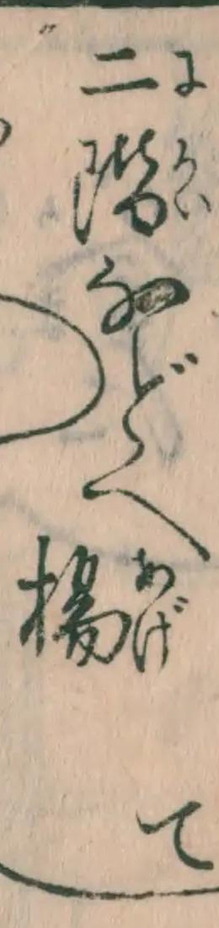二階などへ揚
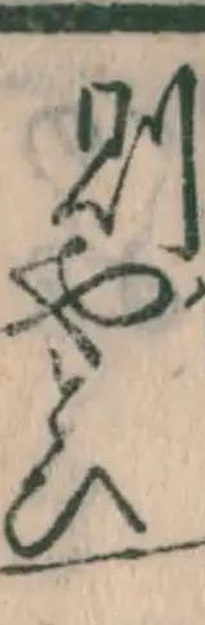則やとひ
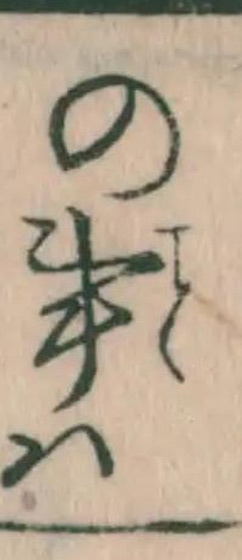の事は
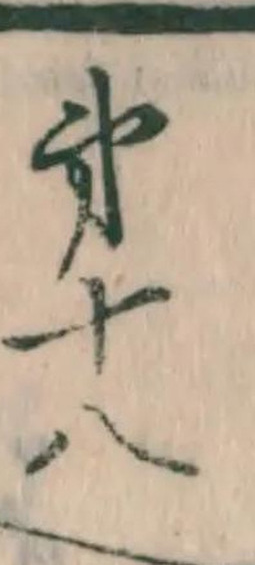第十八

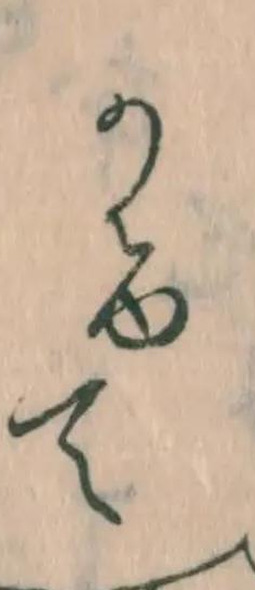かけて

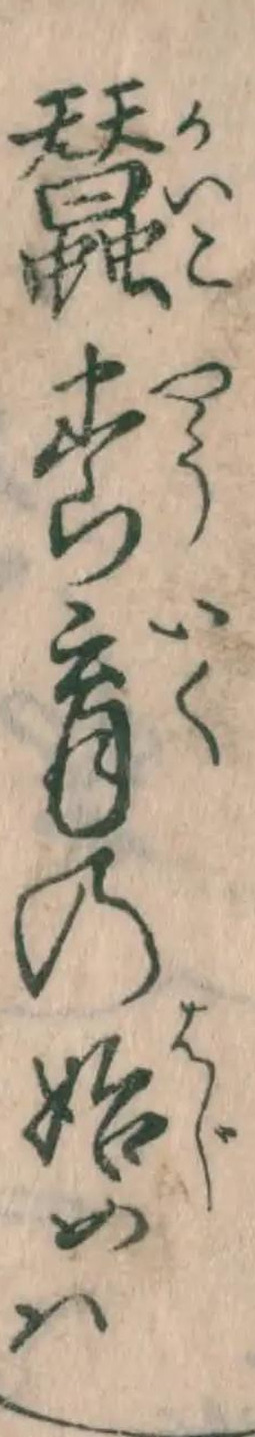蚕養育の始めは
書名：新撰養蚕秘書
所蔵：国立国会図書館 National Diet Library, JAPAN
